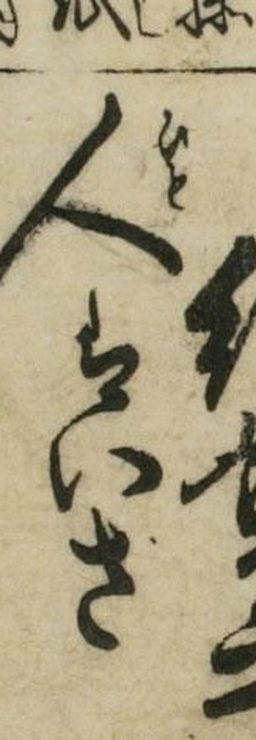人はいさ
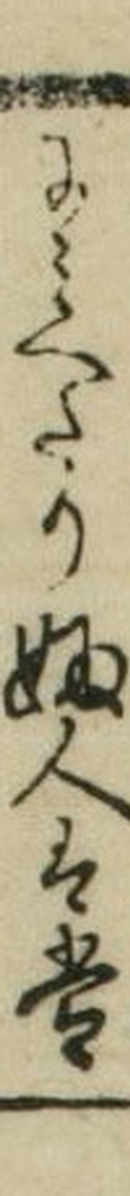にみへたり婦人は常
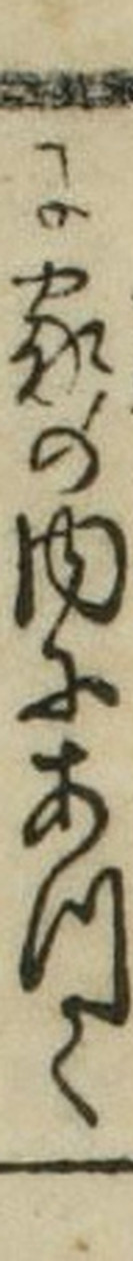に家の内にあつく
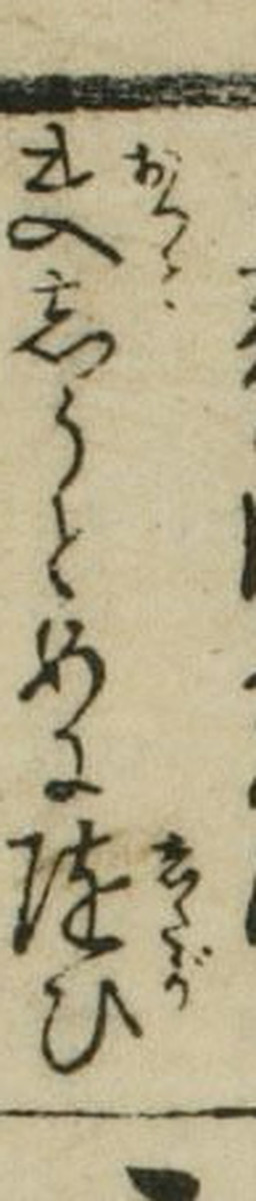夫しうとめに随ひ
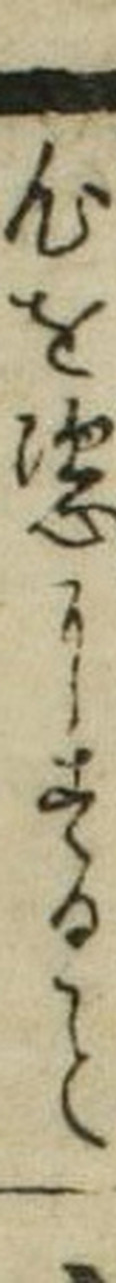心を恣にすること
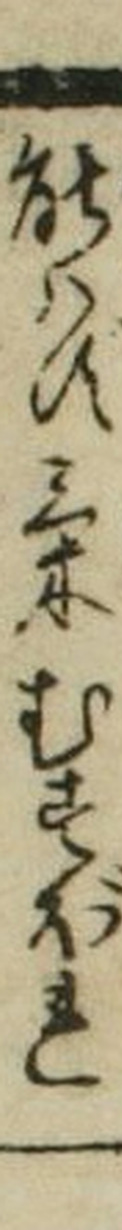能はず気むすぼれ
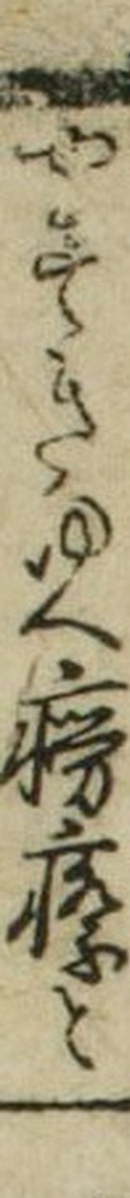やすきゆへ癆瘵と
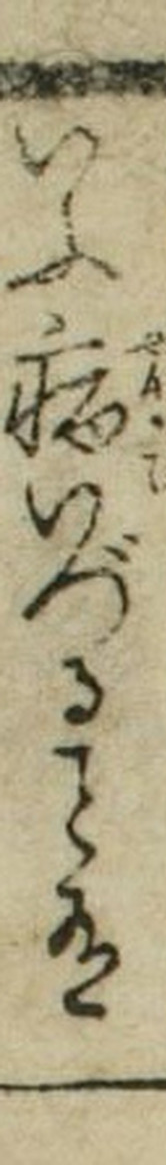いふ病いづること有
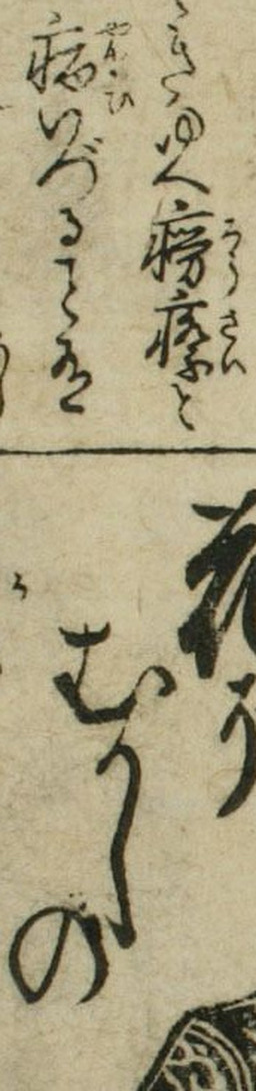むかしの
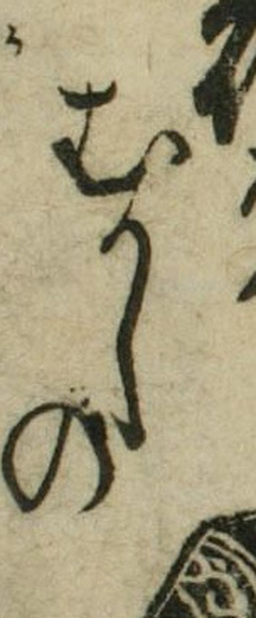むかしの
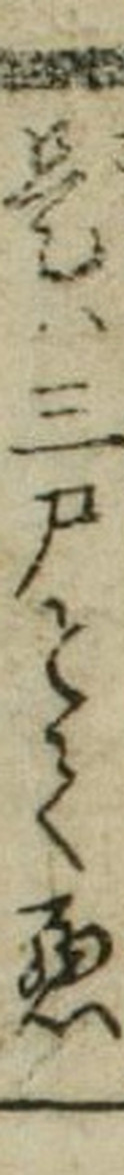是は三尸とて悪
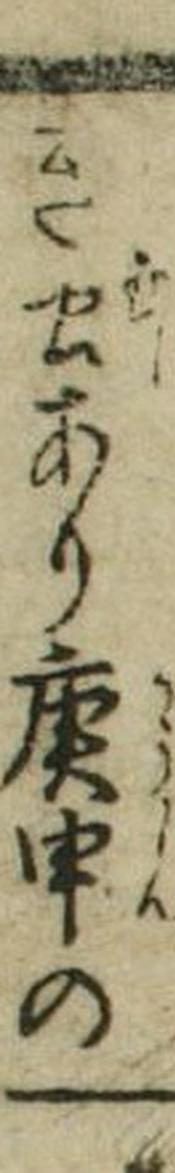き虫あり庚申の
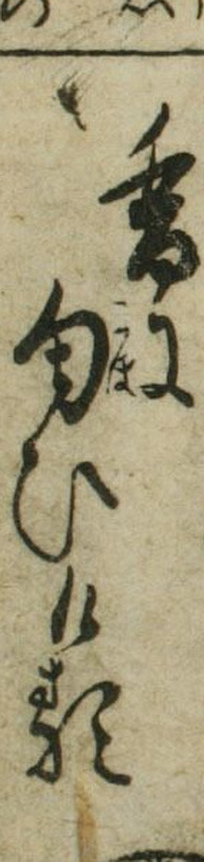匂ひける
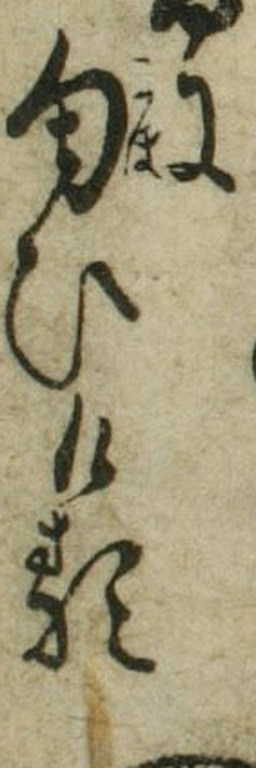匂ひける

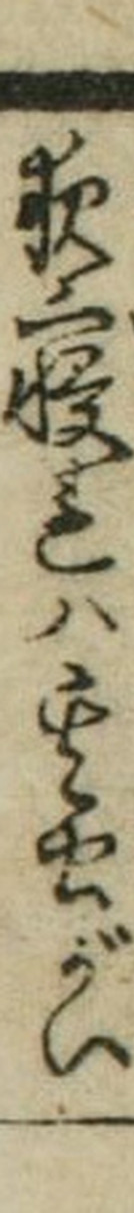夜寝れは其虫がい
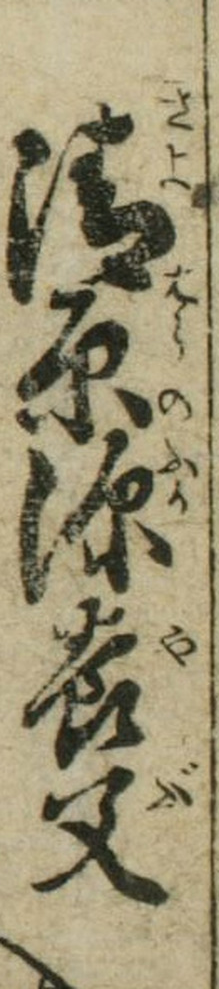清原深養父
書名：百人一首
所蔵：東京学芸大学教育コンテンツアーカイブ
